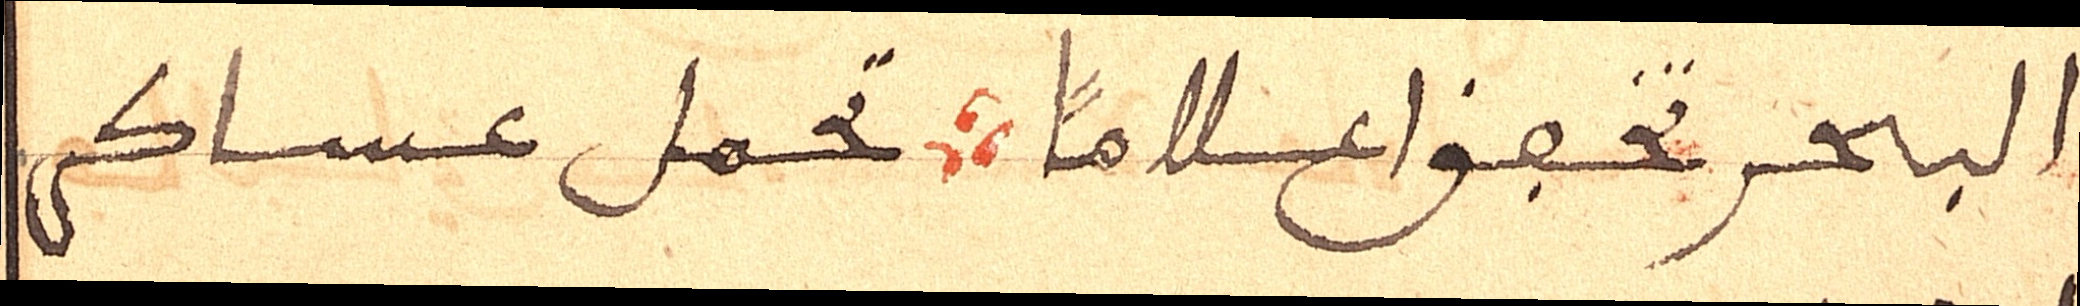البحر تخفق اعلاما تحمل عساكر
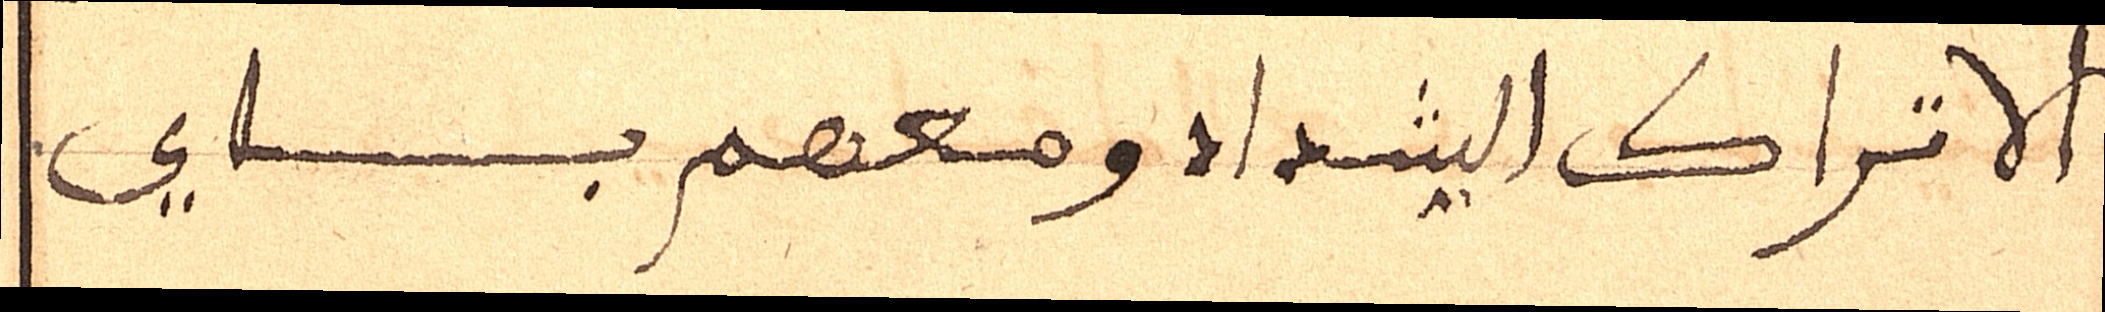الاتراك الشداد ومعهم باي
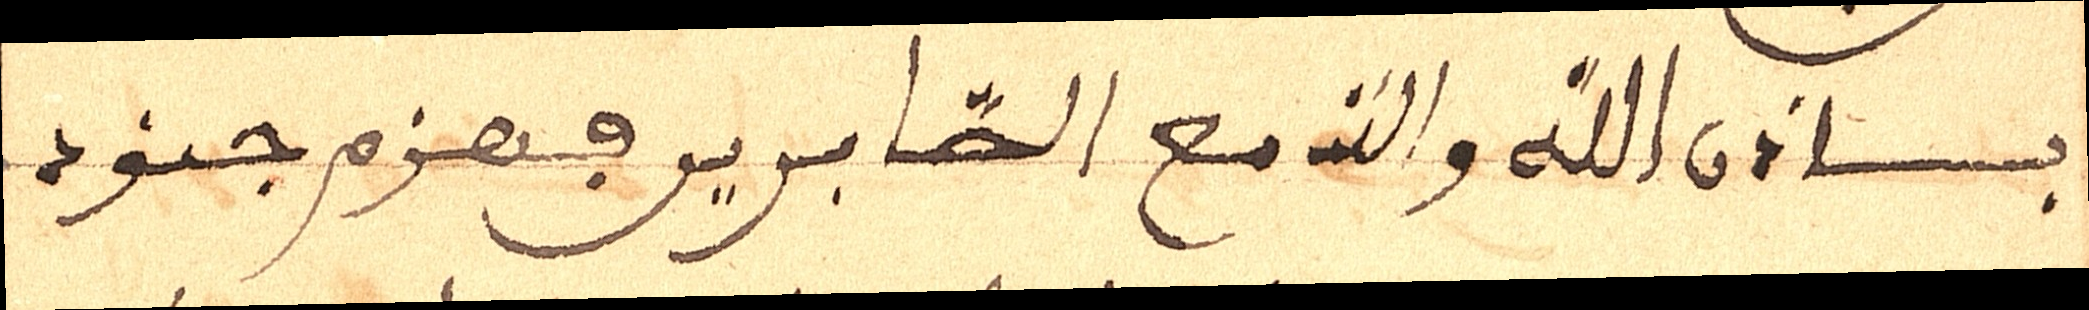باذن الله والله مع الصابرين فهزم جنود
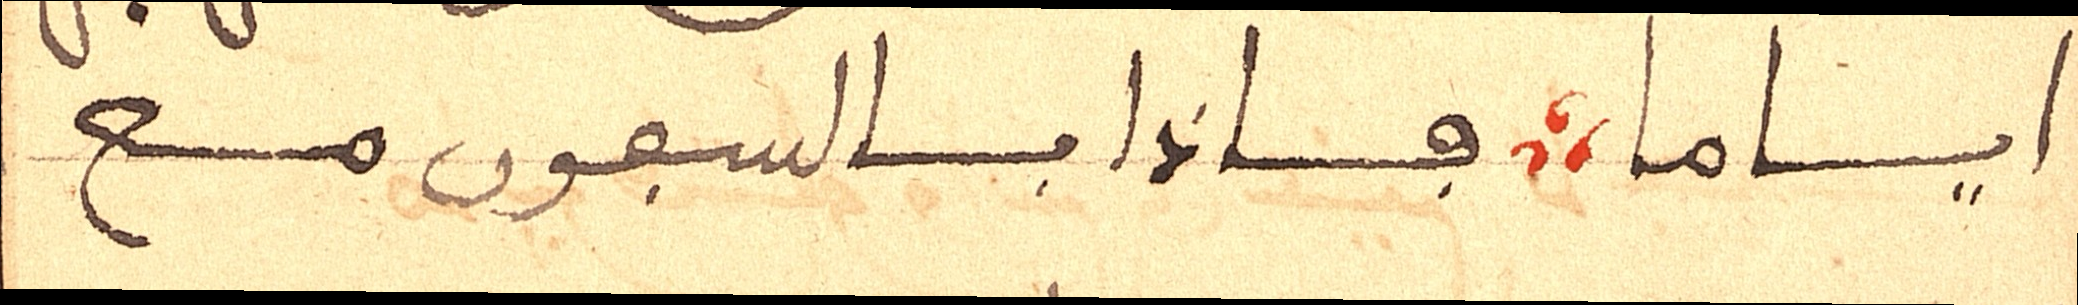اياما فاذا بالسفون مع
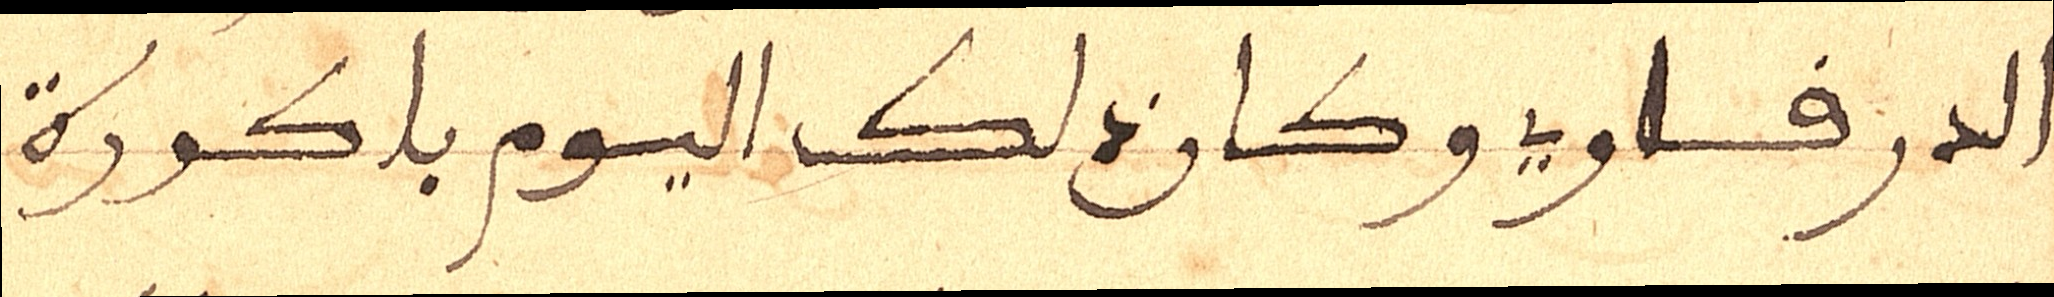الدرقاوي وكان ذلك اليوم باكورة
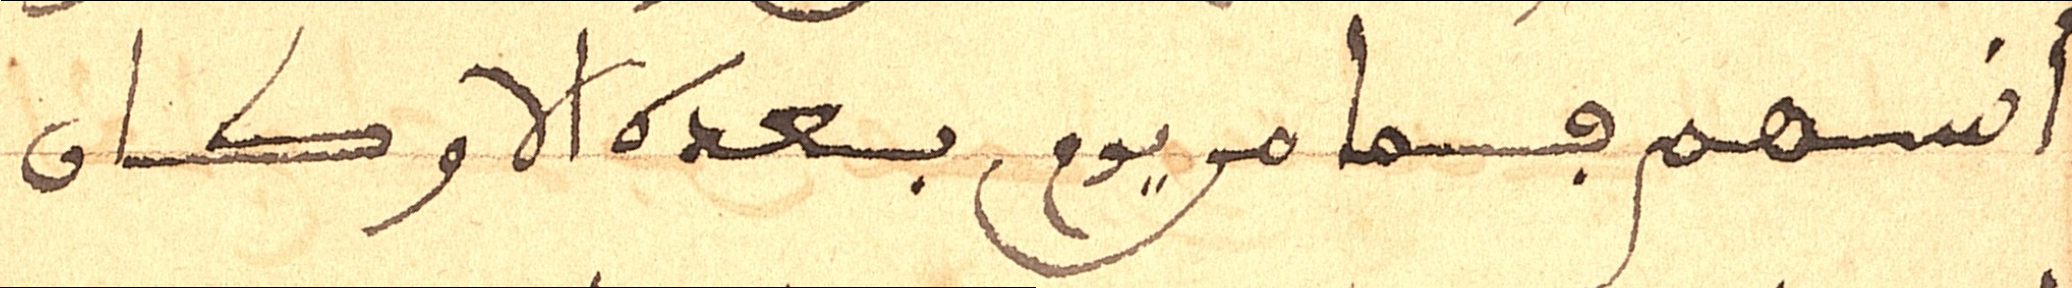انسهم فما من يوم بعده الا وكان
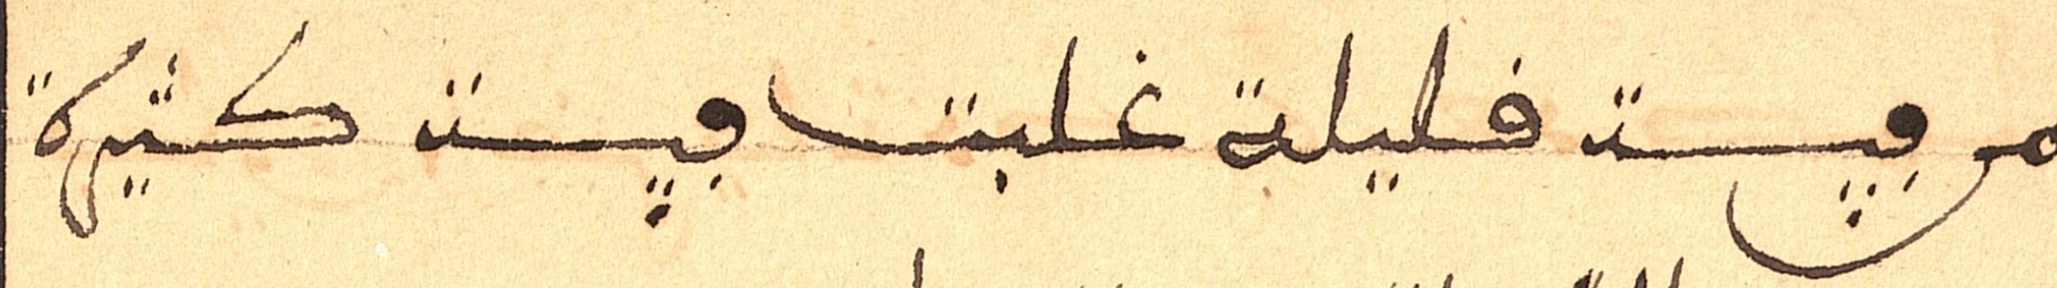من فئة قليلة غلبت فئة كثيرة
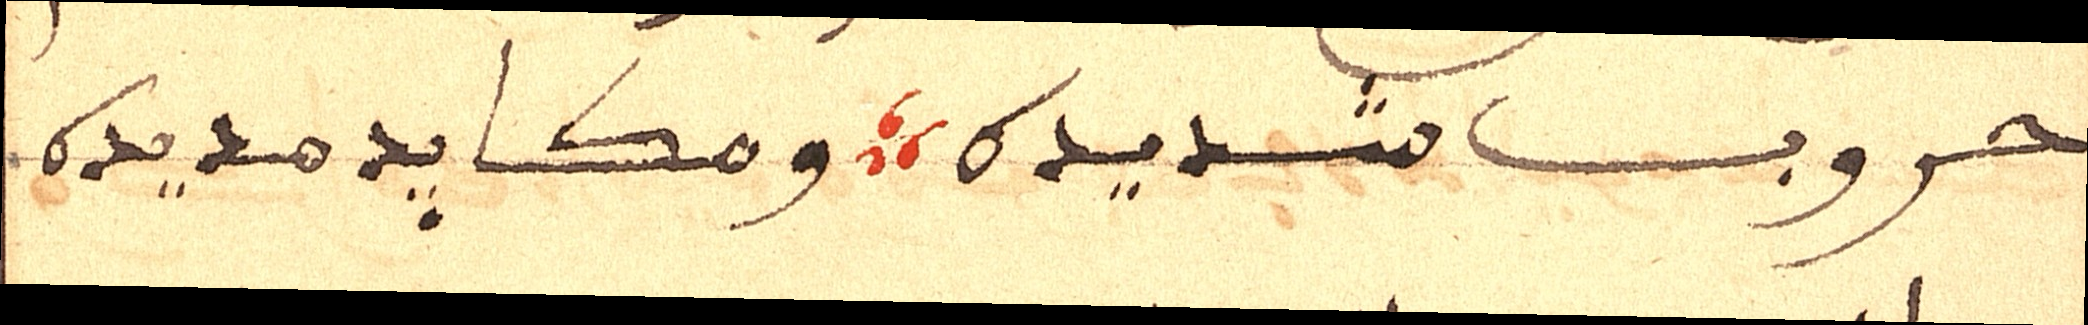حروب شديده ومكائد مديده
